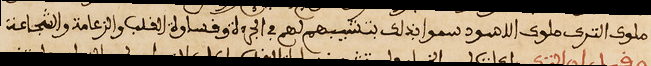ملوك الترك ملوك الاسود سموا بذلك بتشيهم لهم في الجزءة وقساوة القلب والزعامة والشجاعة
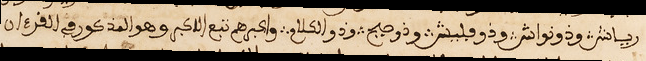رياش وذو نواش وذو فليش وذو صيح وذو الكلام واكبرهم تبع الاكبر وهو المذكور في القرءان
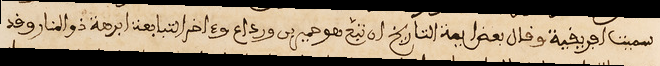سميت افريقية وقال بعض ايمة التاريخ ان تبع هو حمير بن ورداع وءاخر التبابعة ابرهة ذو المنار وقد
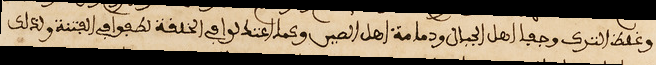وغلظ الترك وجفا اهل الجبال ودمامة اهل الصين وكما اعتدلوا في الخلفة لطفوا في الفتنة ولذلك
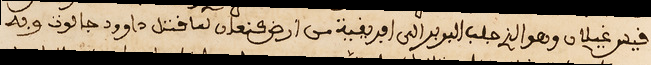قيس غيلان وهو الذي جلب البربر الى افريقية من ارض كنعان لما قتل داوود جالوت وبه
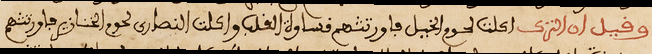وقيل ان الترك اكلت لحوم الخيل فاورتثهم قساوة القلب واكلت النصارى لحوم الخنازير فاورتثهم
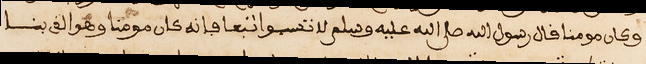وكان مومنا قال رسول الله صلى الله عليه وسلم لا تسبوا تبعا فانه كان مومنا وهو الذي بنا
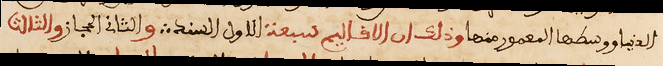الدنيا و وسطها المعمور منها وذلك ان الاقاليم سبعة الاول السند والثانى الحجاز والثالث
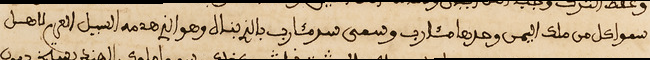سموا كل من ملك اليمن وحدها مئارب وسمى سد مئارب بالذي بناه وهو الذي هدمه السيل العرم لاهل
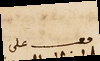على
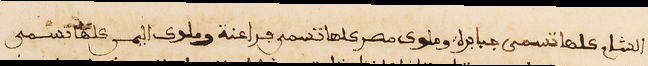الشام كلها تسمى جبابرة وملوك مصر كلها تسمى فراعنة وملوك اليمن كلها تسمى
